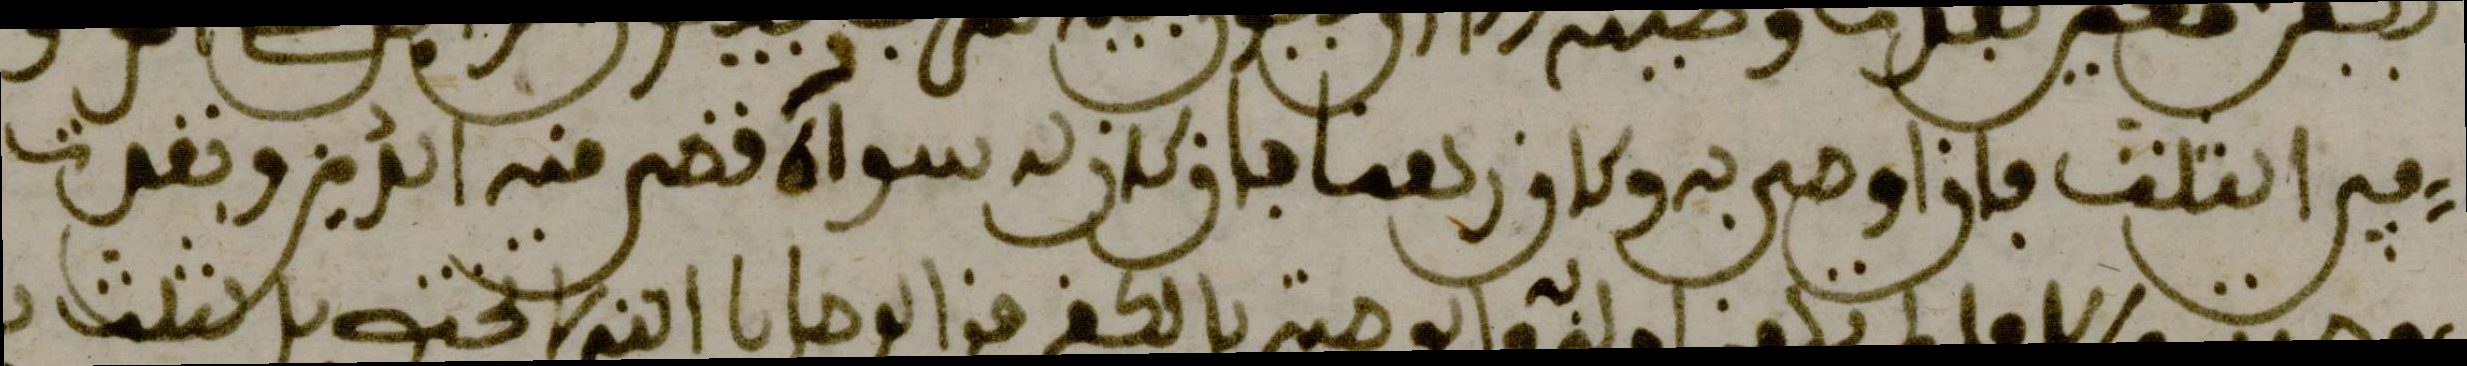في الثلث فان اوصى به وكان رهنا فان كان له سواء قضى منه الدين ونفذت
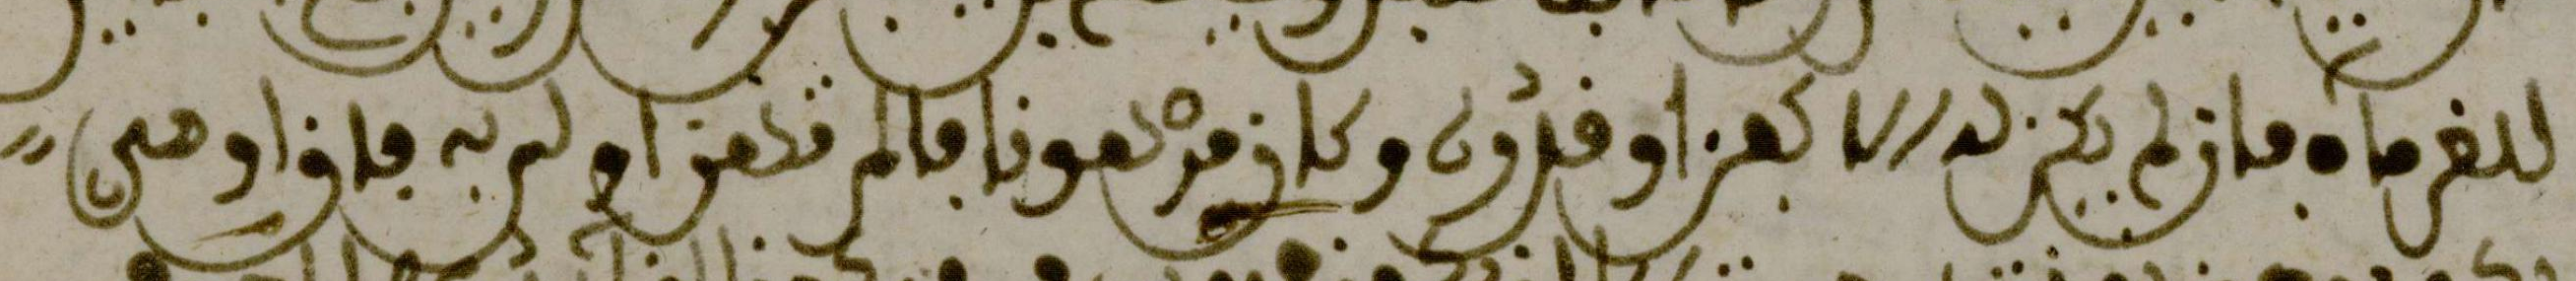للغرماء فان لم يكن له الا كفن او قدره وكان مرْهونا فالمرتهن اولى به فان اوصى
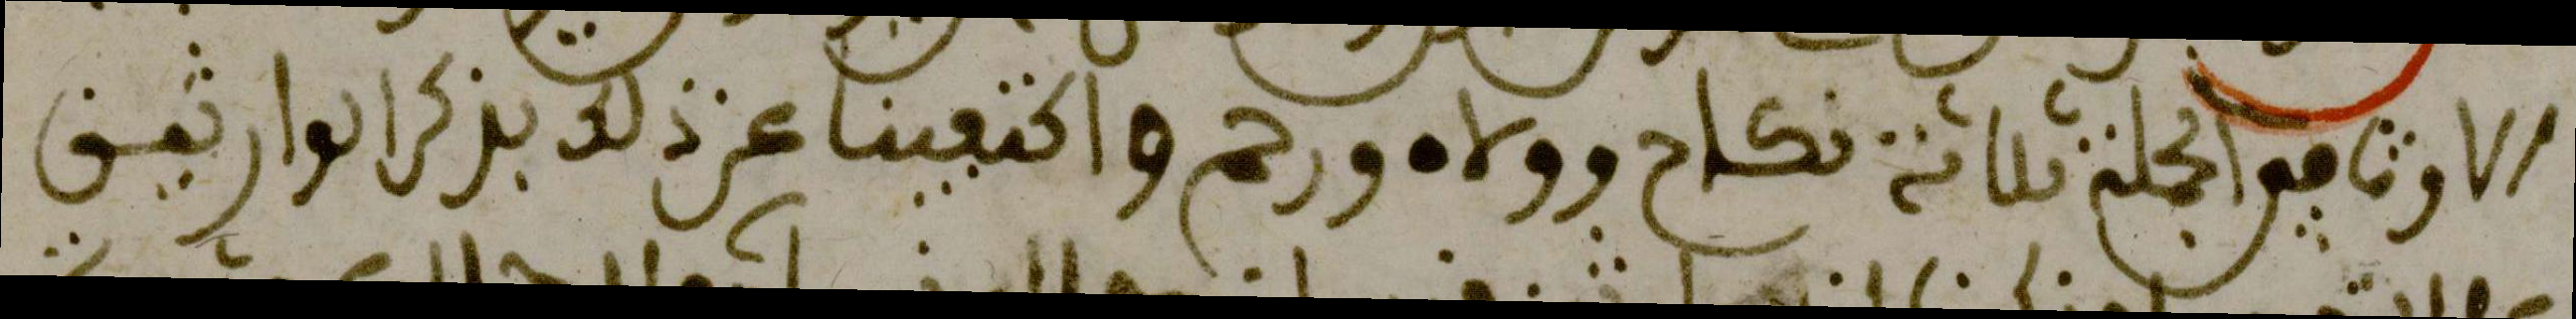الارث في الجملة ثلاثة نكاح وولاء ورحم واكتفينا عن ذلك بذكر الوارثين
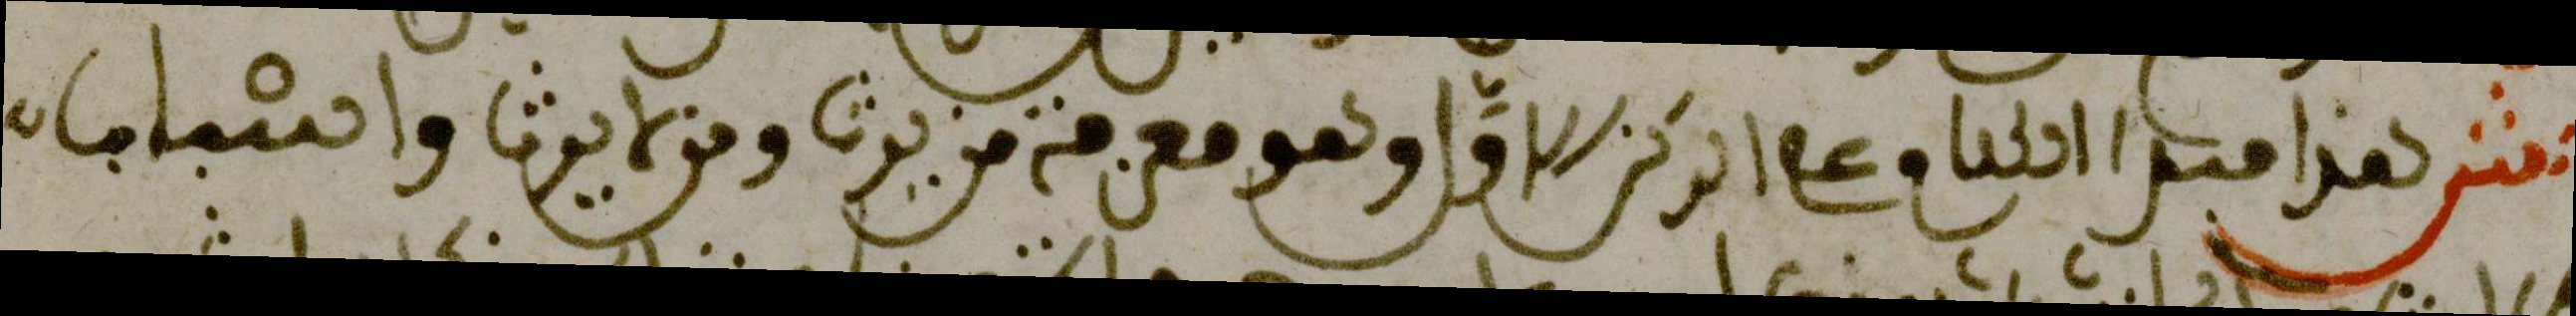ش هذا مبدا الكلام على الركن الاوّل وهو معرفة من يرث ومن لا يرث واسْباب
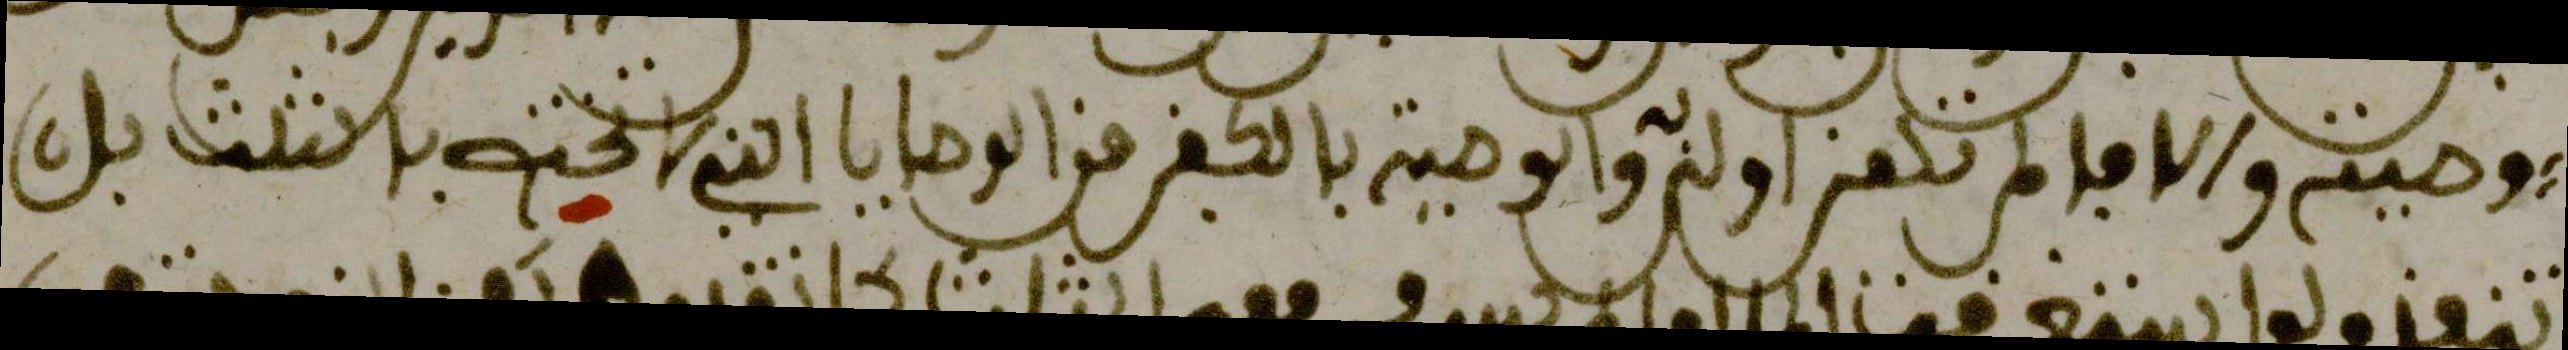وصيته ولا فالمرتهن اولى والوصية بالكفن من الوصايا التي لا تختص بالثلث بل
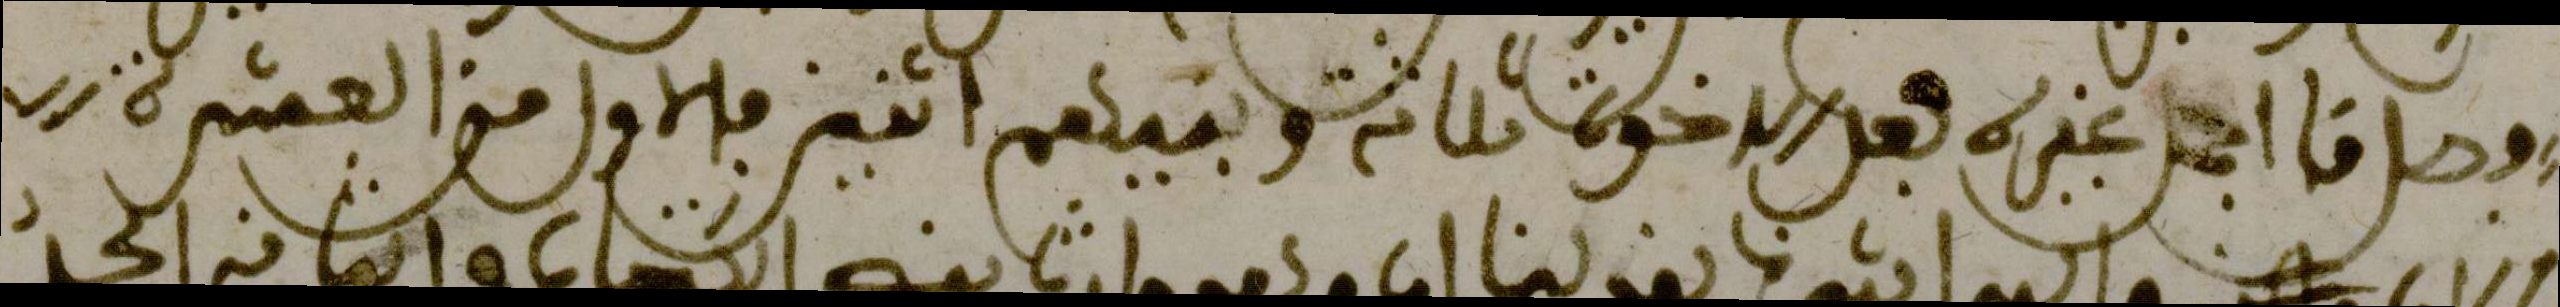فصل ما اجمل غيره فعد الاخوة ثلاثة وبنيهم اثنين فالاول من العشرة
